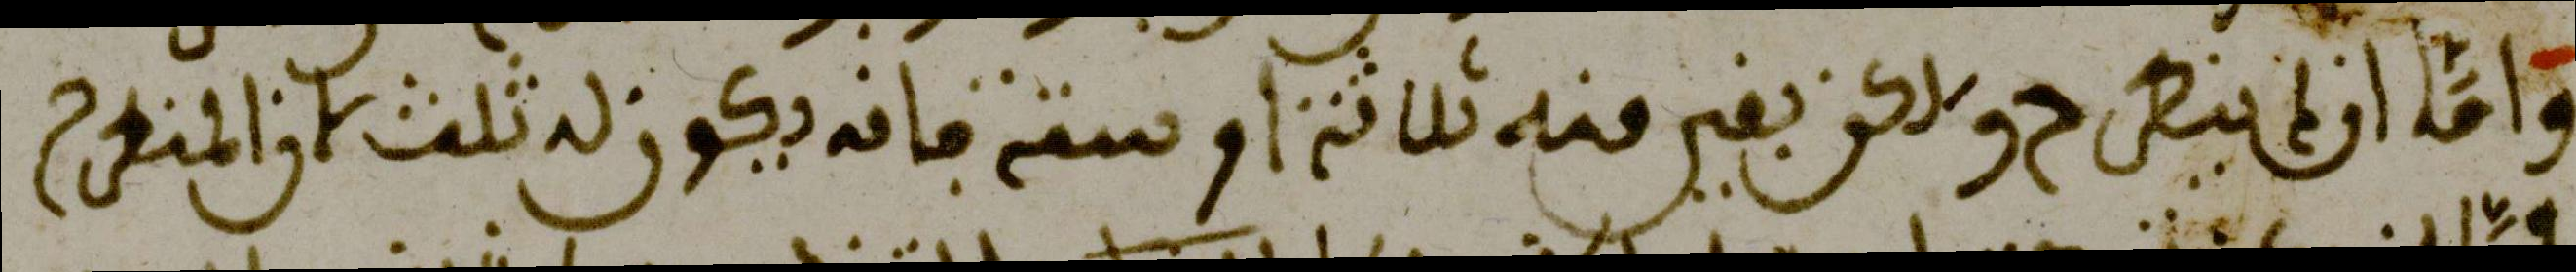وامّا ان لم ينطرح ولكن بقي منه ثلاثة او ستة فانه يكون له ثلث لان المنطرح
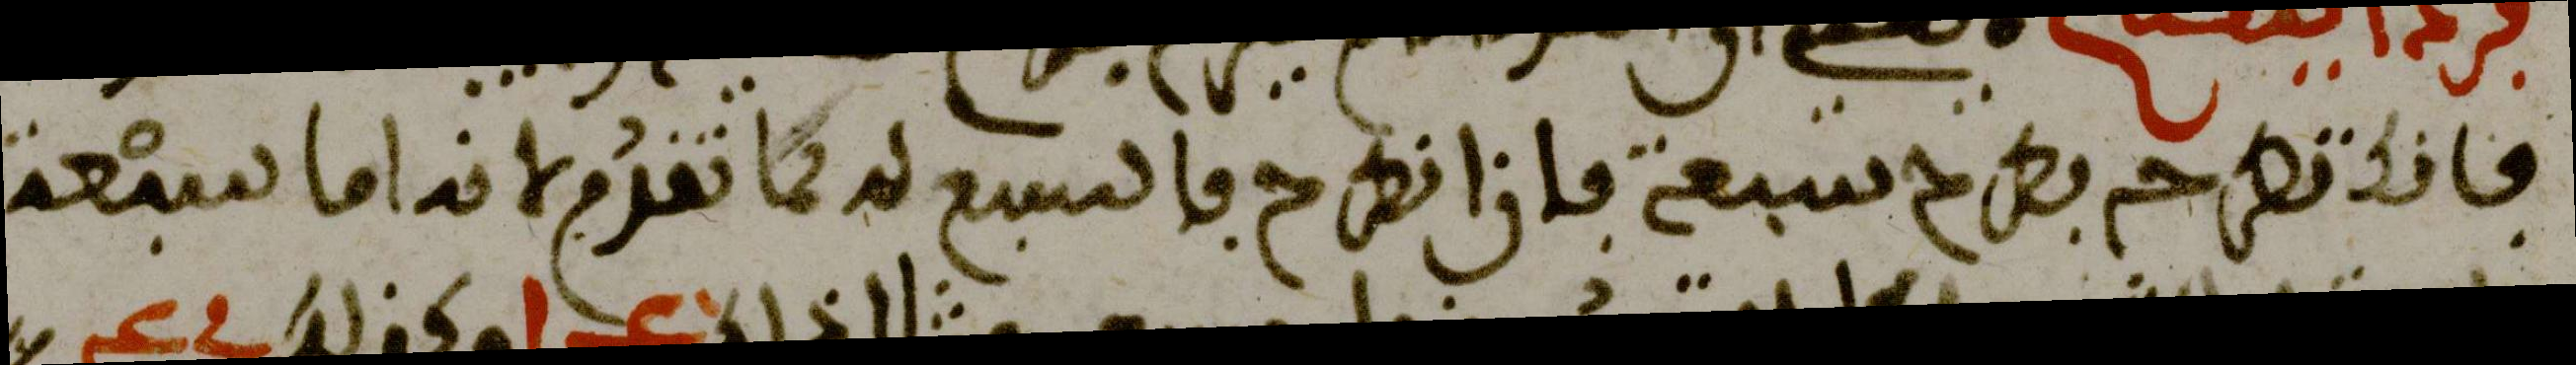فانك تطرحه بطرح سبعة فان انطرح فالسبع له كما تقدم لانه اما سبْعة
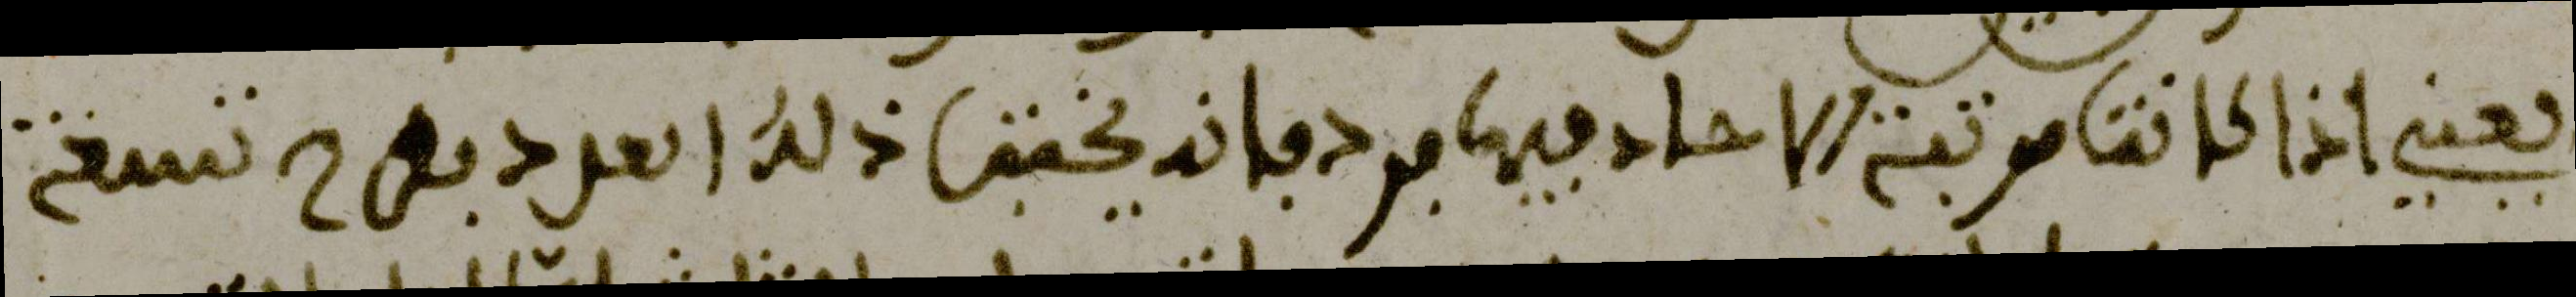يعني اذا كانت مرتبة الاحاد فيها فرد فانه يختبر ذلك العدد بطرح تسعة
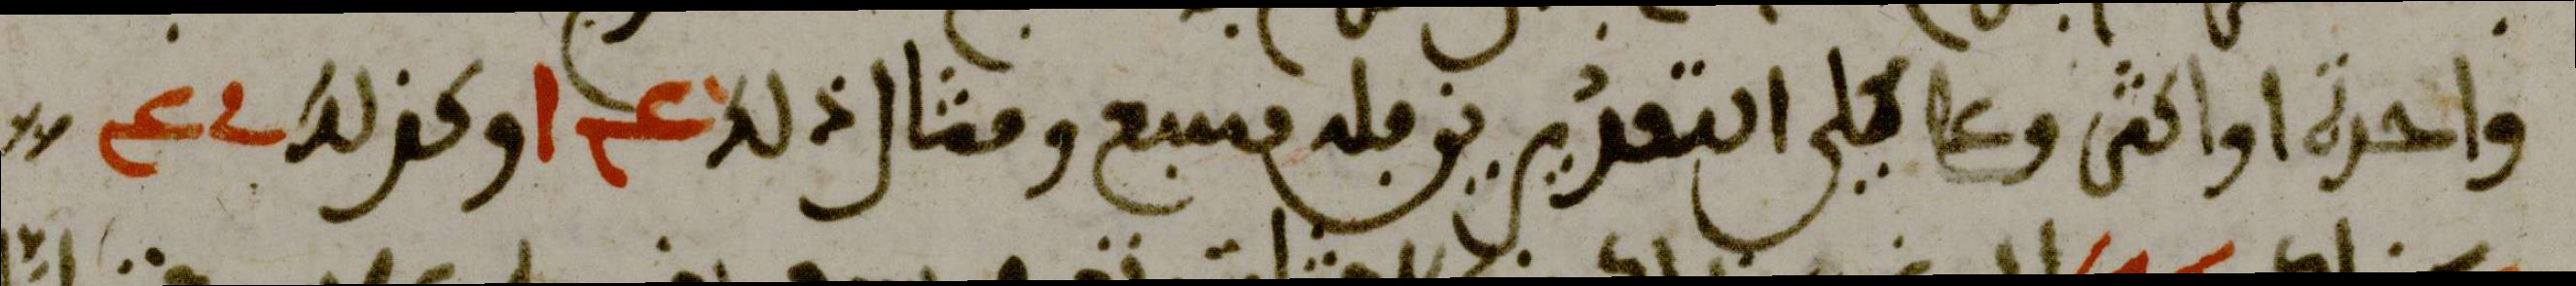واحدة او اكثر وعلى كلي التقديرين فله سبع ومثال ذلك 14 وكذلك 42
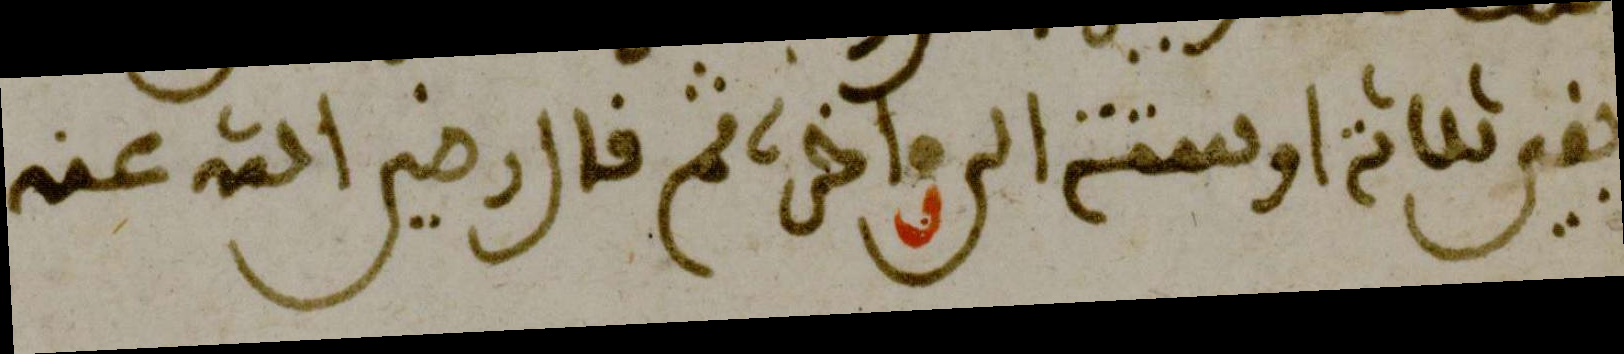بقي ثلاثة او ستة الى ءاهره ثم قال رضي الله عنه
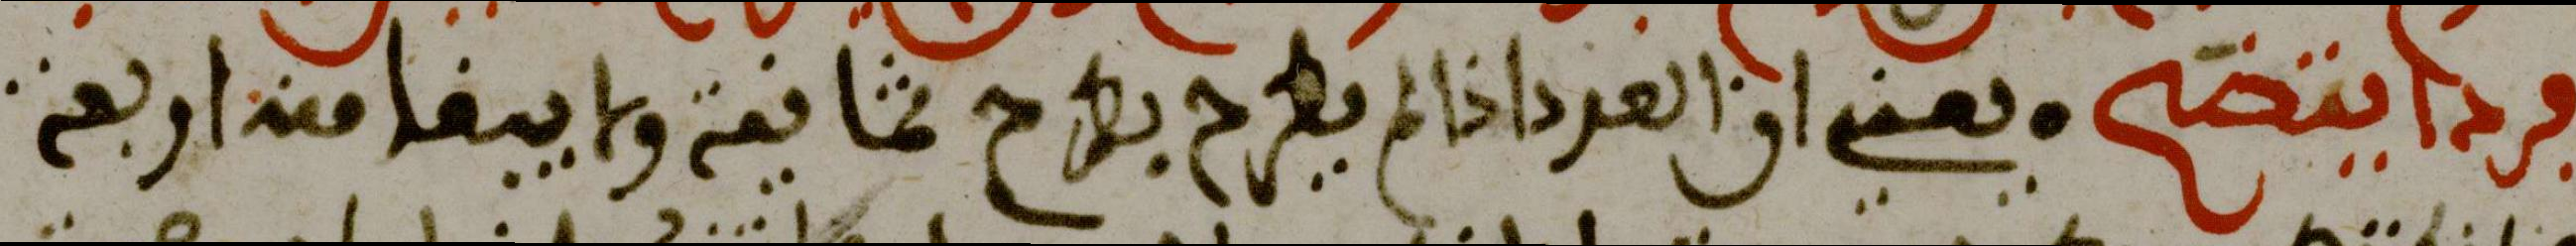فردا يتضح يعني ان العدد اذا لم يطرح ثمانية ولا يبقا منه اربعة
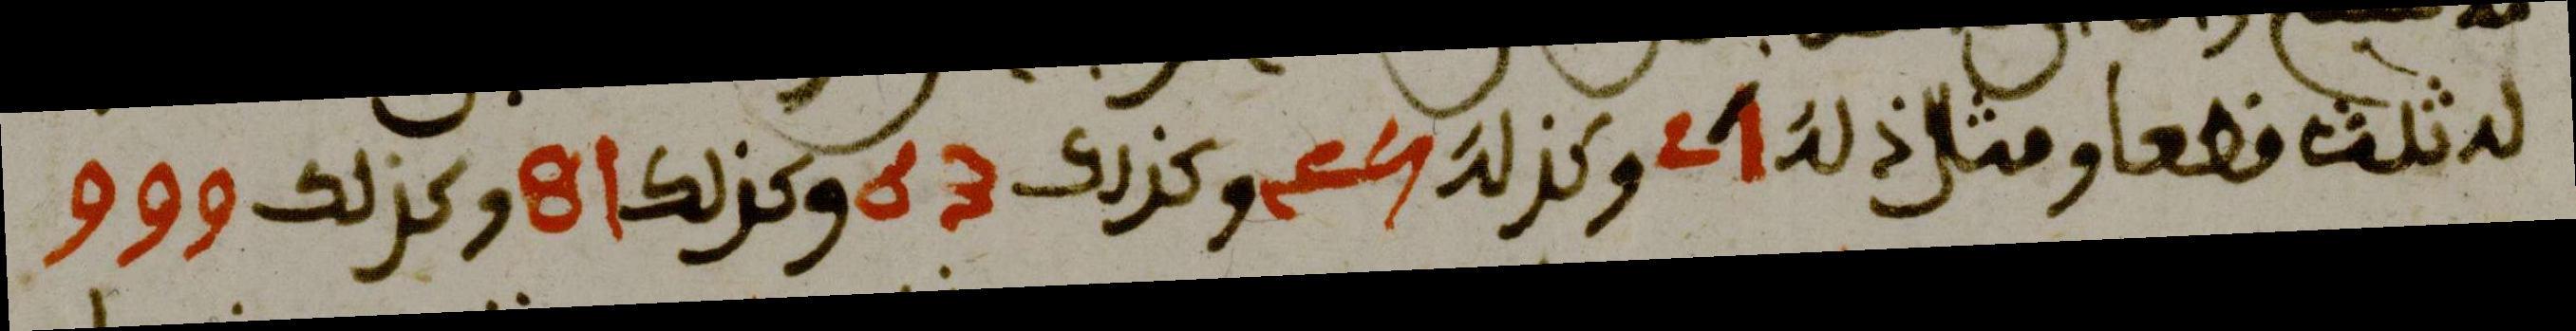له ثلث قطعا ومثال ذلك 21 وكذلك 45 وكذلك 23 وكذلك 81 وكذلك 999
